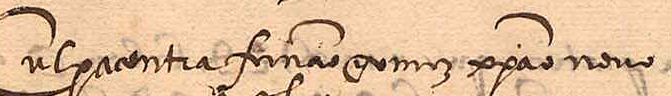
Culpa contra fernão gomez xpão nouo
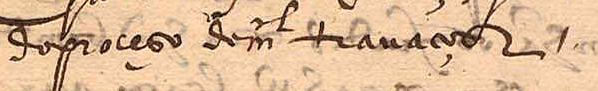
do proceso de mel trauaços /
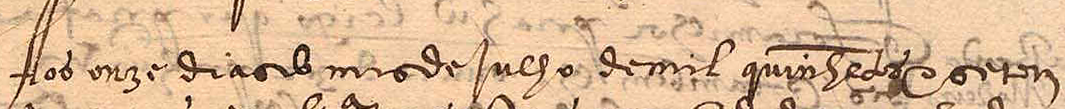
Aos onze dias do mes de Julho de mil quinhētos e seten
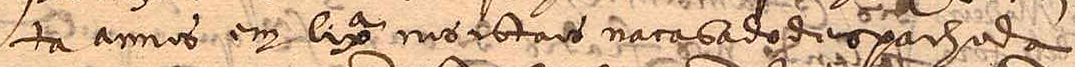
ta annos em lixa nos estaos na casa do despacho da
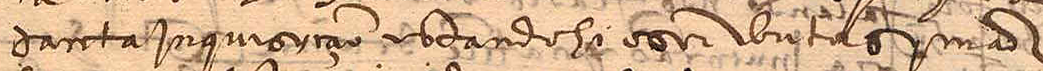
santa Jnquisyção estando hi o sōr doutor symão
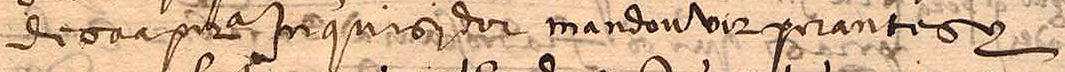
de saa pera Jnquisydor mandou vir perante sy
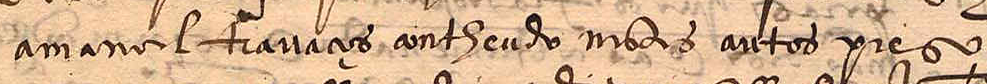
a manoel trauaços contheudo nestes autos preso
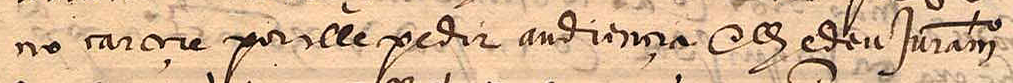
no carcere por elle pedir audiencia e lhe deu Juramto
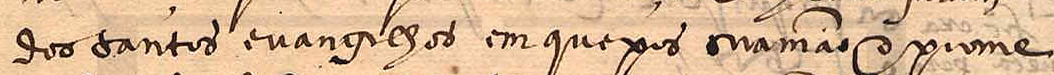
dos santos euangelhos em que pos sua mão e prome
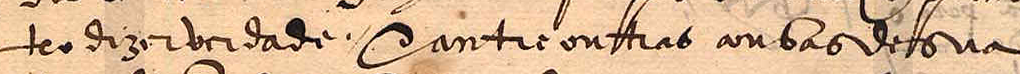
teo dizer verdade / e antre outras cousas de sua
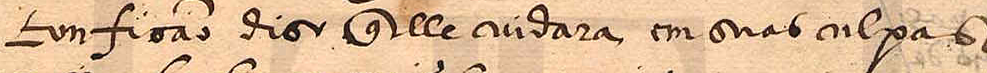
confisão dise q̄ elle cuidara em suas culpas
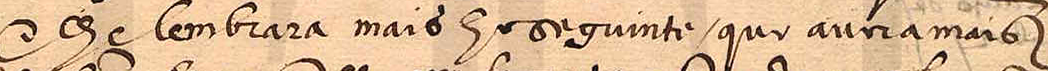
e lhe lembrara mais ho seguinte / que auera mais
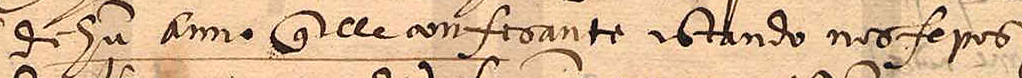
de hū anno q̄ elle confesante estando nos ferros
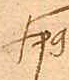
tp̄ꝯ
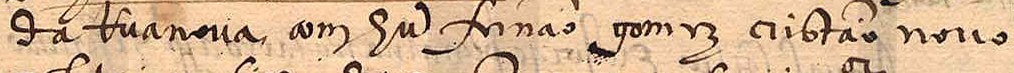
da Rua noua com hū fernão gomez cristão nouo
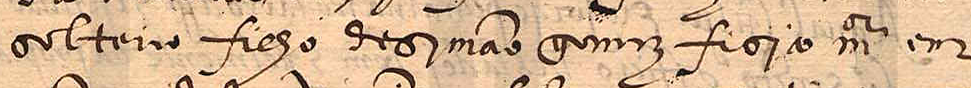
solteiro filho de symão gomez fisjco mor em
